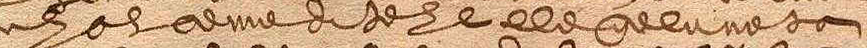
nhas como dito he llogo eu nota
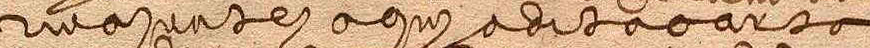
rio ajuntej aquj a dita carta
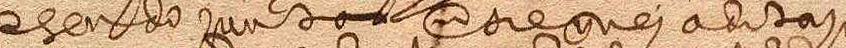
e sendo junta ētreguej a dita jn
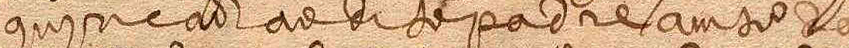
quiriçaõ ao dito padre amto da
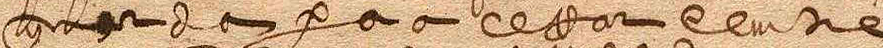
guarda ꝑa a ceRar e emtre
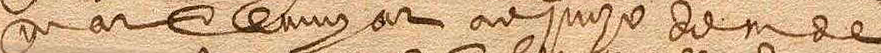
guar e enujar ao juizo domde
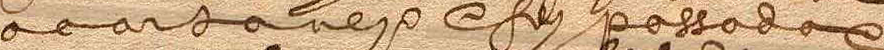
a carta uejo e foj passada e
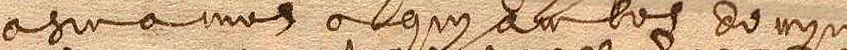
asinamos aquj ambos domjn
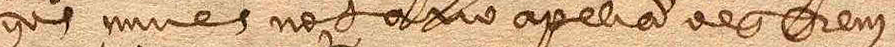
gos nunes notario apllicō o escreuj
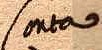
Conta
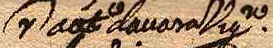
item to da uara Vigro.
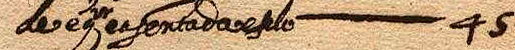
de ēqir e asentada e selo 45
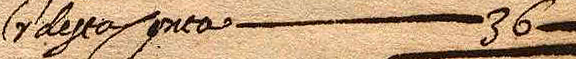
item desta Conta 36
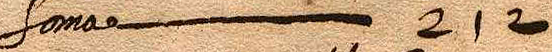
Soma 212
